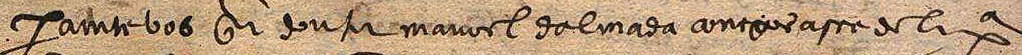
ꝑamte vos sōr doutor manoel dalmada conego ē a see de lixa
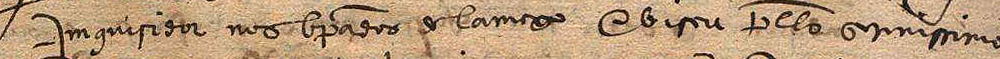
Jmquisidor nos bpādos de lamego e viseu p̄llo serenissimo
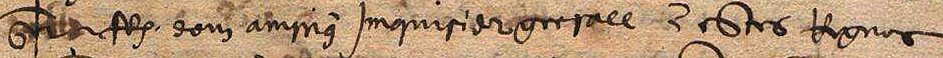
s̄or iffꝭ dom amrriq̄ Jmquisidor geerall ē estes Regnos
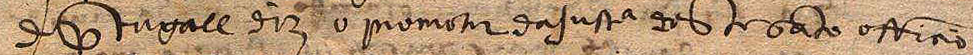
de p̄tugall diz o promotor da Justa deste sāto officio
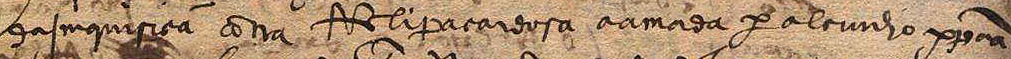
da Jmquisicā cōtra ffelipa cardosa aamada ꝑ alcunho xp̄aa
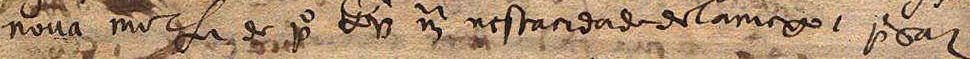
noua molher de po Rōjz mor nesta cidade de lamego / p̄sa /
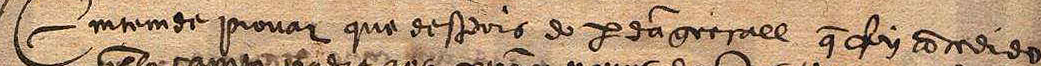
Emtemde prouar que despois do ꝑdā geerall q̄ foy cōcedido
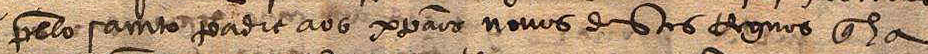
p̄llo samto padre aos xpãos nouos destes Regnos q̄ ha
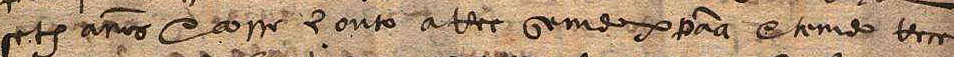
setꝭ an̄os e corre ē outo a Ree semdo xpāa e temdo Rece
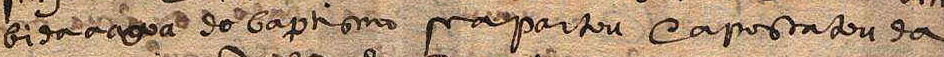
bida a agoa do baptismo se apartou e apostatou da
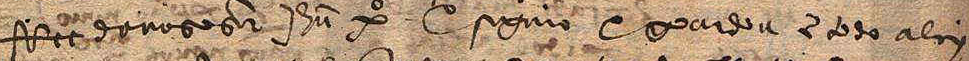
ffee de noso sōr Jhū xo e seguio e goardou ē todo a ley
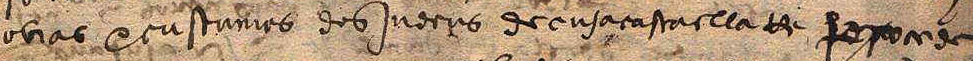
obras e custumes dos Judeus de cuja casta ella Re proçeede
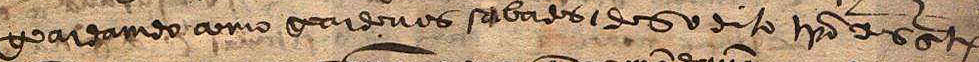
goardamdo como goardou os sabados / des o dito tpō dos setꝭ
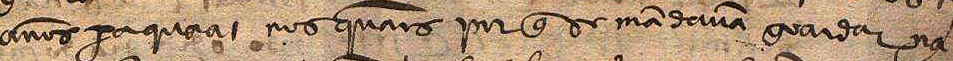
an̄os ꝑa quaa / nos q̄uaes porq̄ se mādauā goardar na
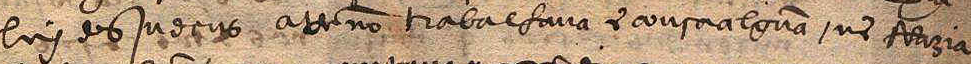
ley dos Judeus a Re n̄o trabalhaua ē cousa algūa / nē ffazia
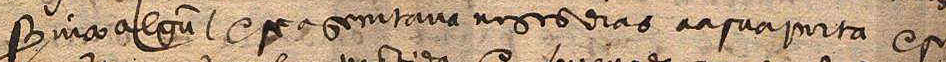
ꞩuiço algū / e se asemtaua neses dias aa sua porta e se
